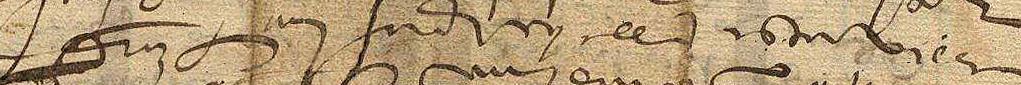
diaz tam Judicyall ē esta villa
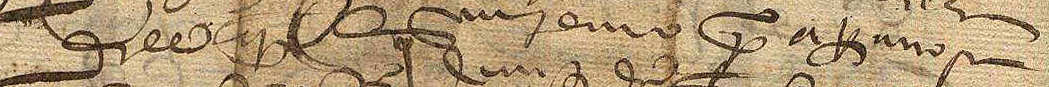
dallāq̄r e seu termo p̄o a Ra nosa
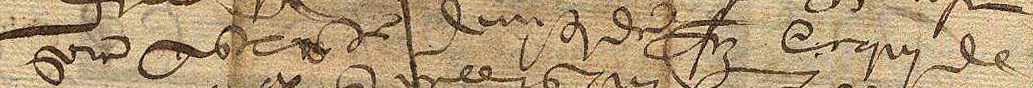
sorā q̄ este esto de certjdā fiz e aquj de
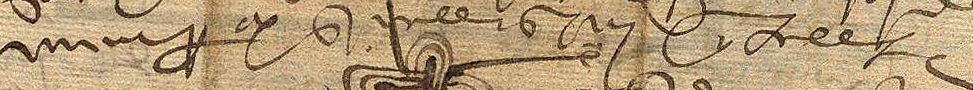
meu ꝓco sjnall asjnej q̄ tall he
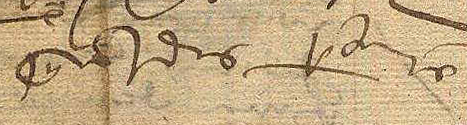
p̄g cō Jdas Rta rs̄
